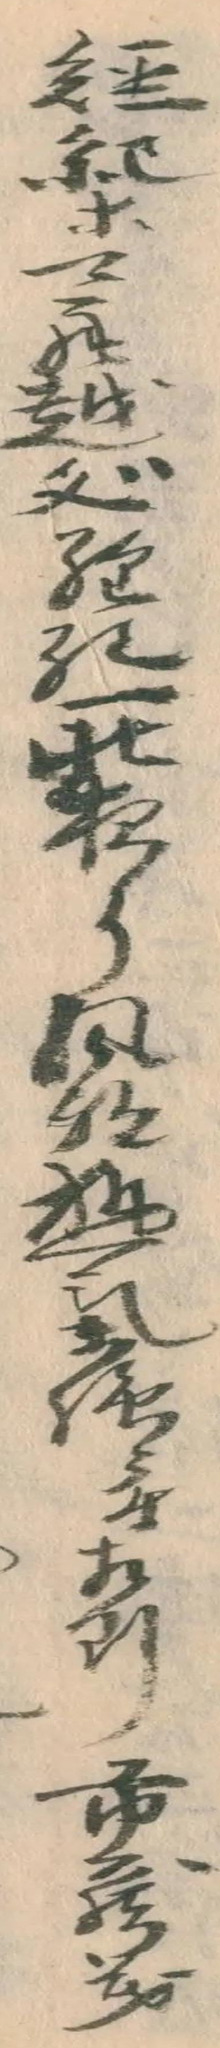経紀等可罷越処経紀一昨夜ゟ風邪熱氣強二付相断市蔵義
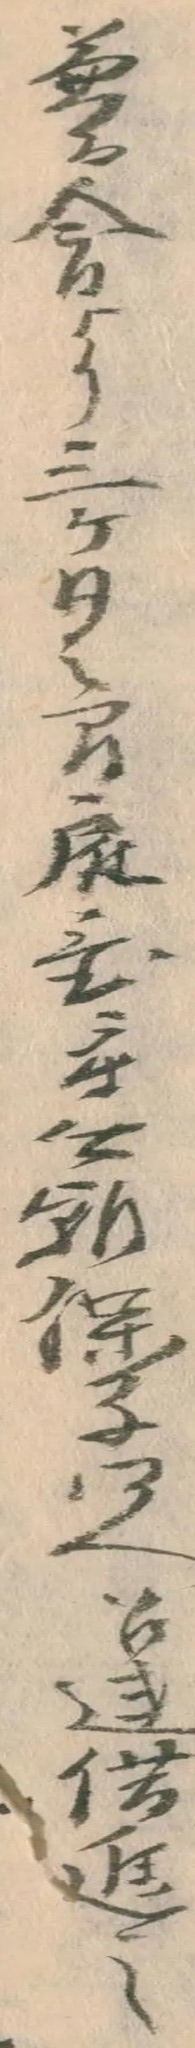兼而今日より三ヶ日之間雇置ニ付今朝保子同人召連借進之
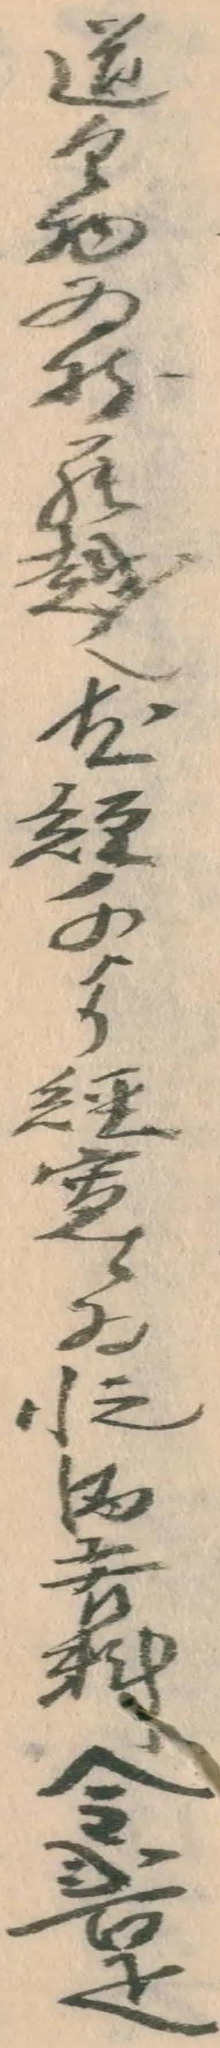道具物為持罷越也尤経千より経寛へ為祝酒肴料金弐百疋
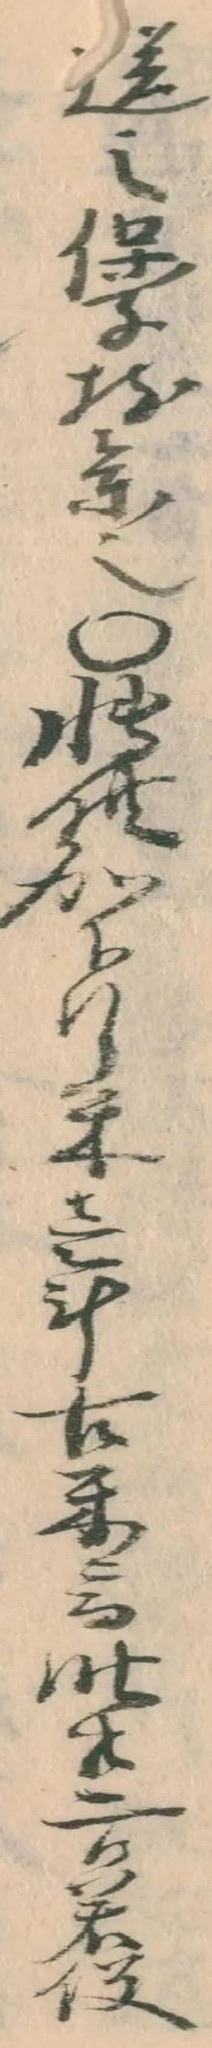送之保子持参也○轉供加下行米壱斗古米ニ而昨廿二日若役
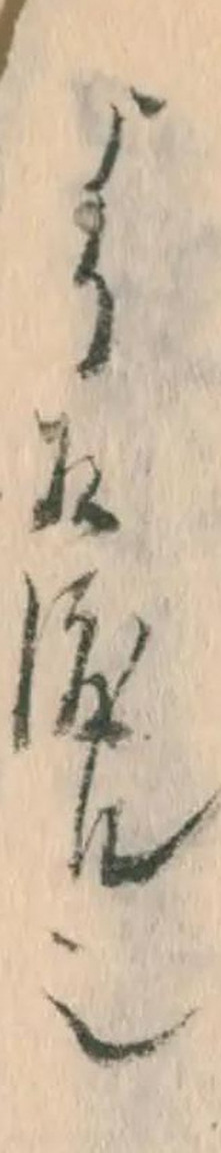より相渡ル也
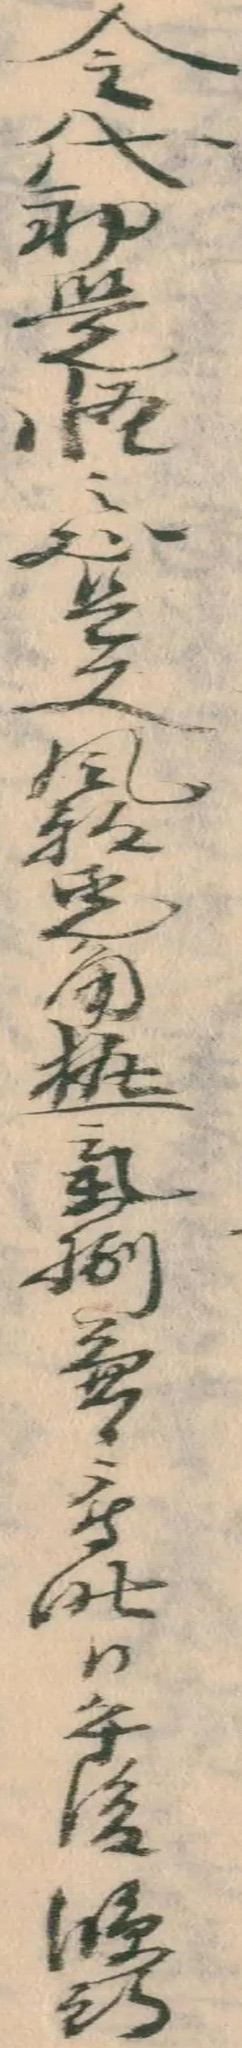令代勤覚悟之処是又風邪兎角熱気捌兼候ニ付昨日午後臨時
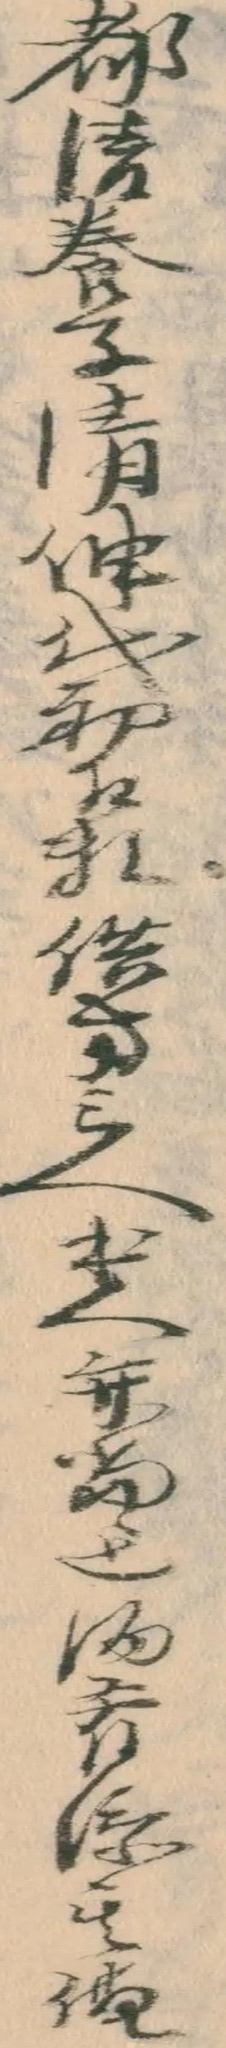都清養子清伸代勤相頼供方三人出人并當迄酒肴添其儘
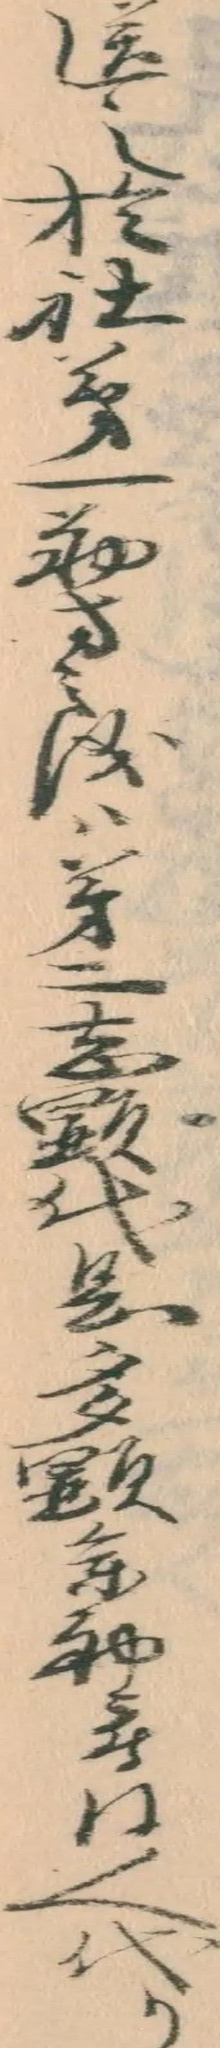送之於社第一勤方之儀ハ第二志顕代息多顕参勤ニ付同人代リ
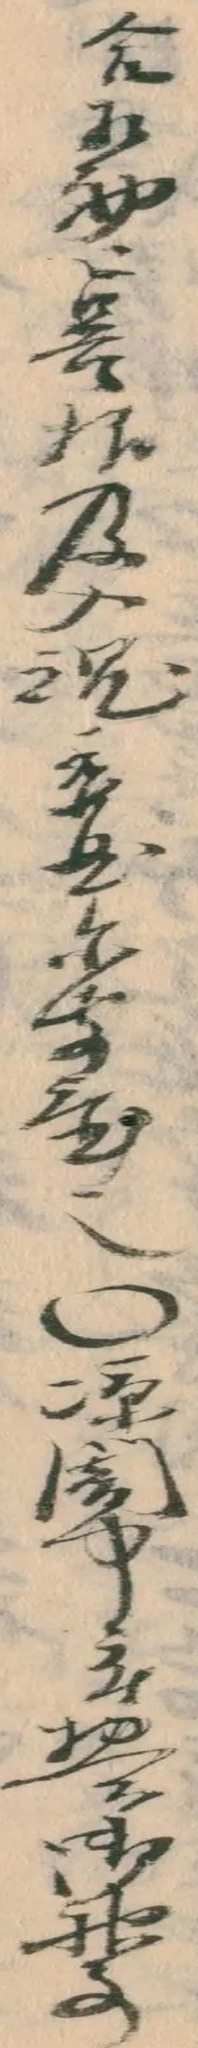合相勤被呉候様及入魂委曲示聞置也○涼闇中ニ付惣而御神事
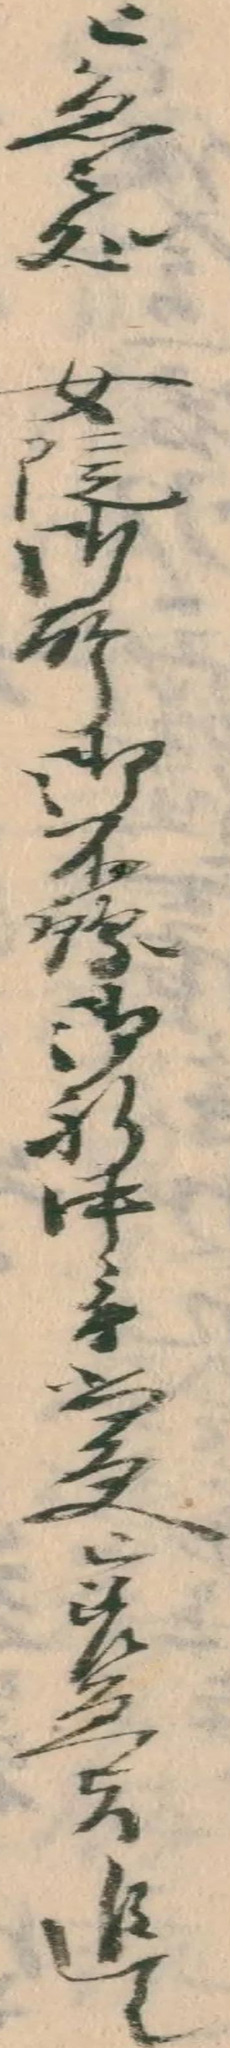被思召候処女院御所御不豫御祈中ニ付尚更被差置旨追々
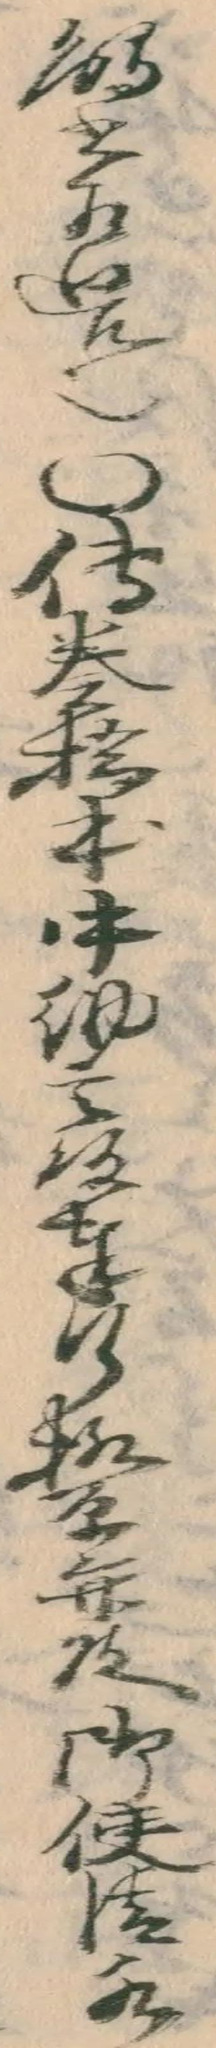觸書相廻也○傳奏橋本中納言殿奉行柳原弁殿御使清水
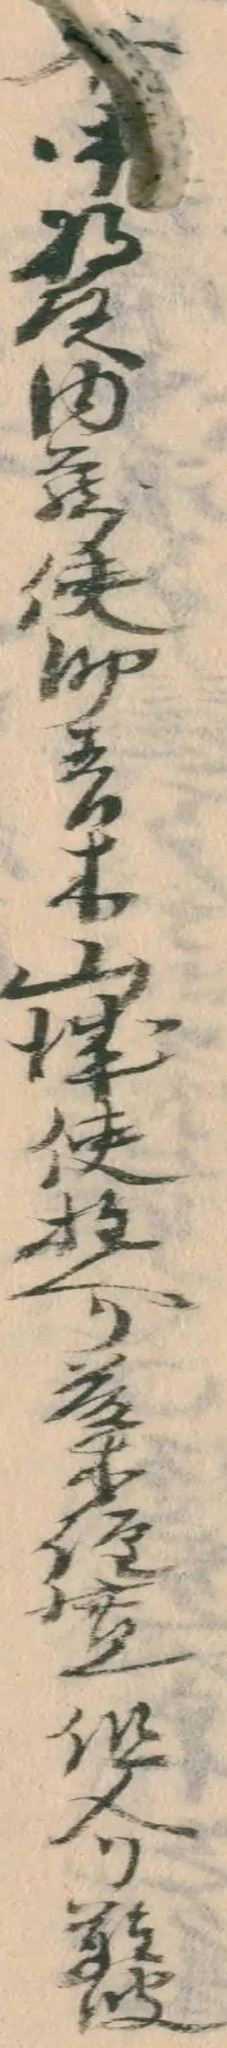谷中将殿内蔵使助青木山城使権介藤木経寛但介難波
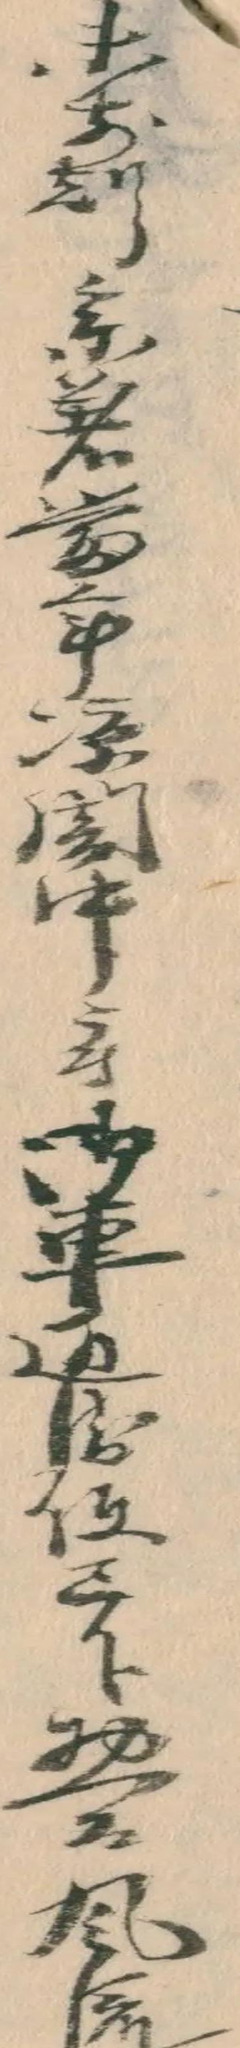未前刻参着當年涼闇中ニ付御車近衛使已下惣而風流
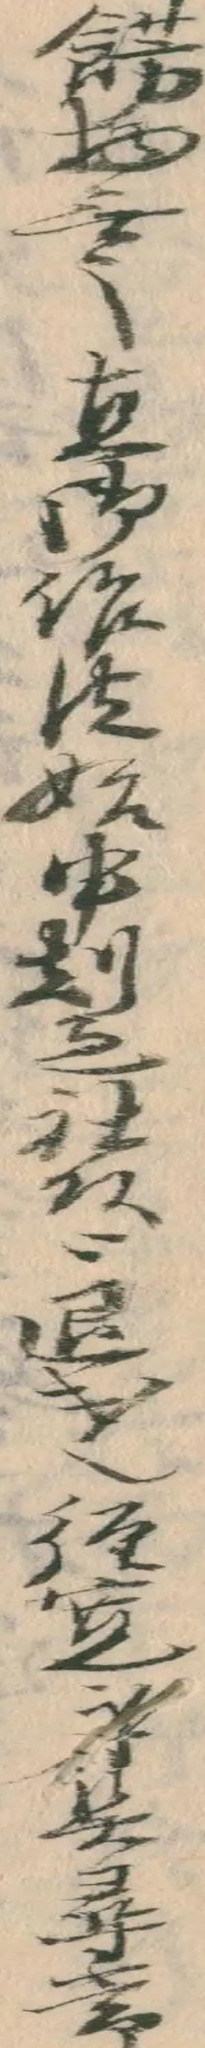餝物無之直御作法始申刻過社頭御退出也経寛身具尋常
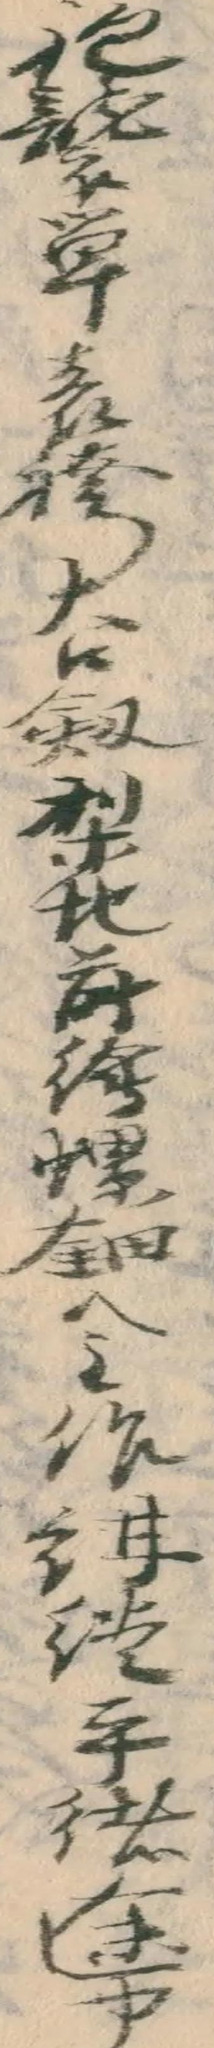袍襲単表袴大口劔梨地蒔繪螺鈿金作紺談平緒途中
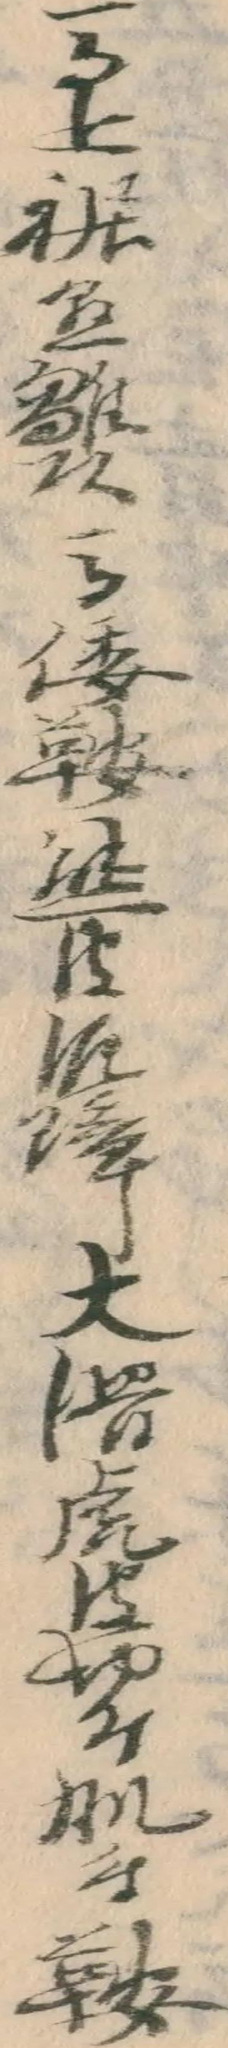馬上裾懸雛頭馬倭鞍熊皮泥障大滑虎皮切付肌付鞍
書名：賀茂社記録. 第70冊
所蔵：国立国会図書館 National Diet Library, JAPAN
